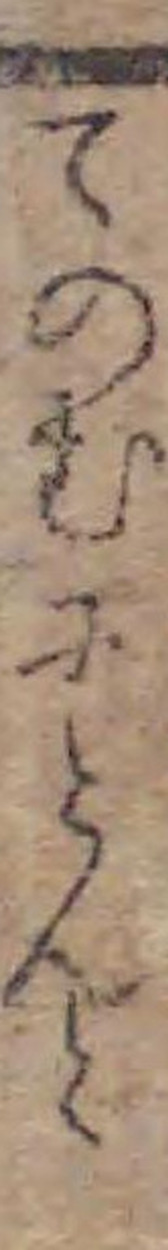てのむにとんと
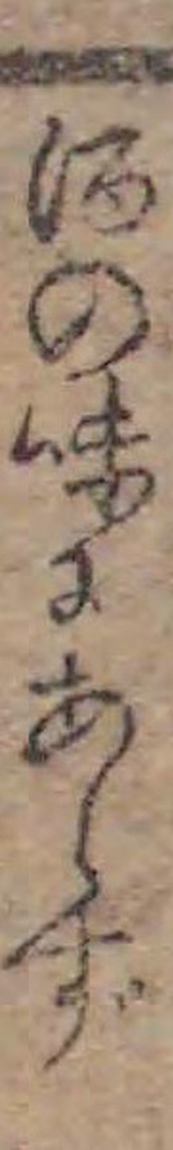酒の味にあらず
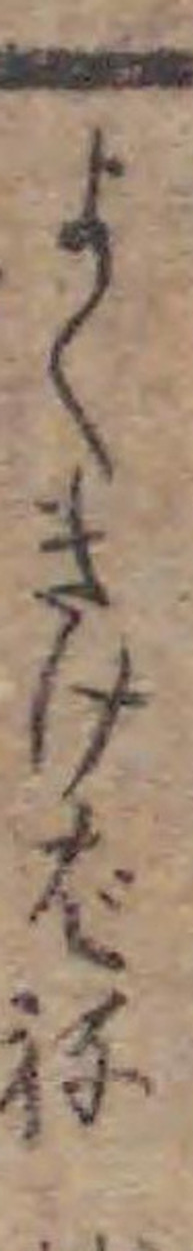よくきけばね
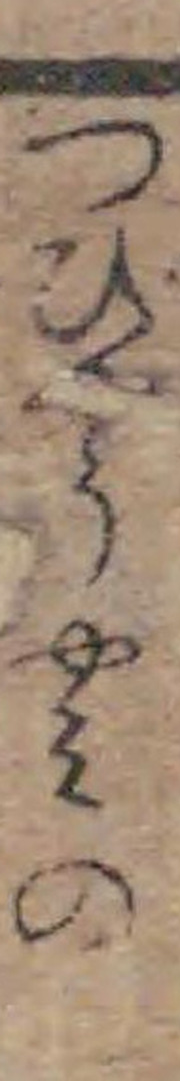つびやうやみの
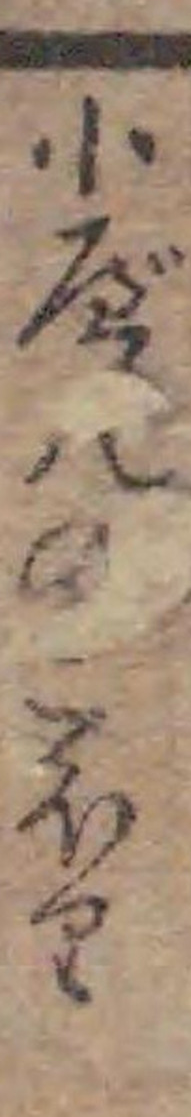小べんのこほり
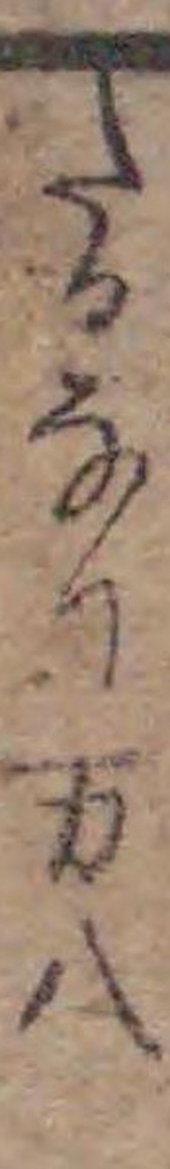たるなり万八
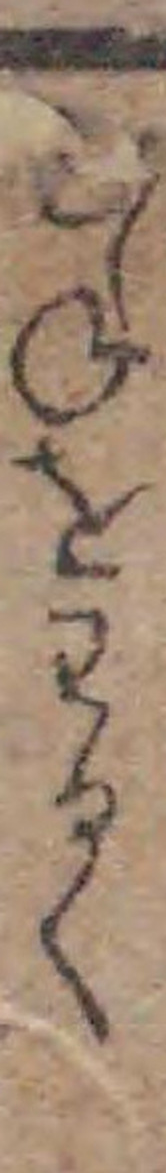むねをわるく
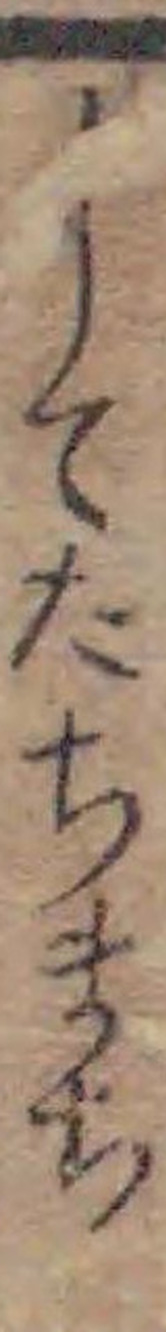してたちまち
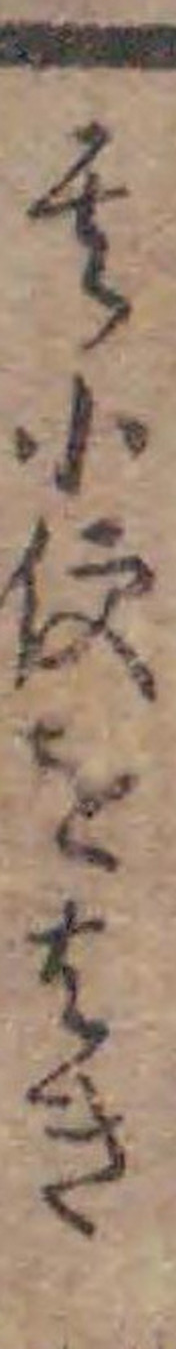其小便をはき
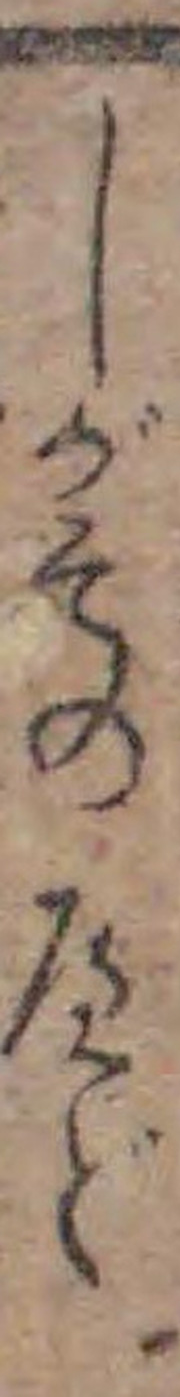しがそのへど
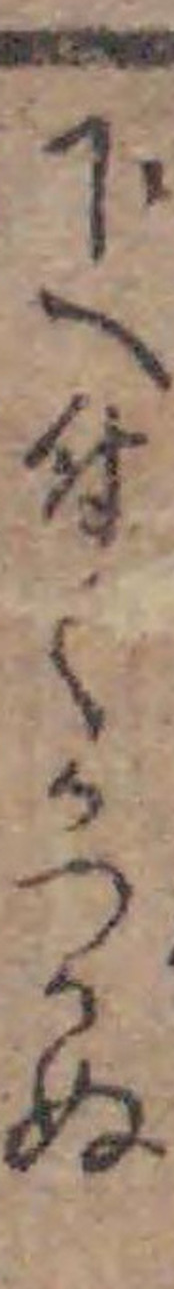下へ付くかつかぬ
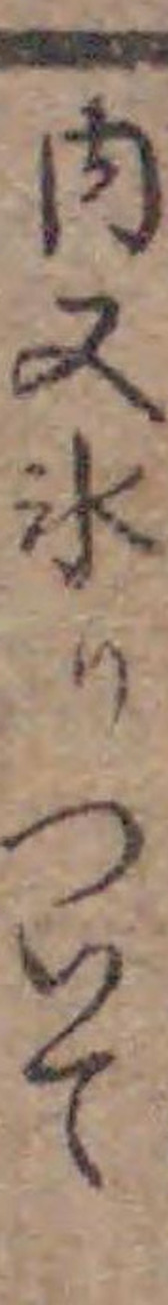内又氷りついて
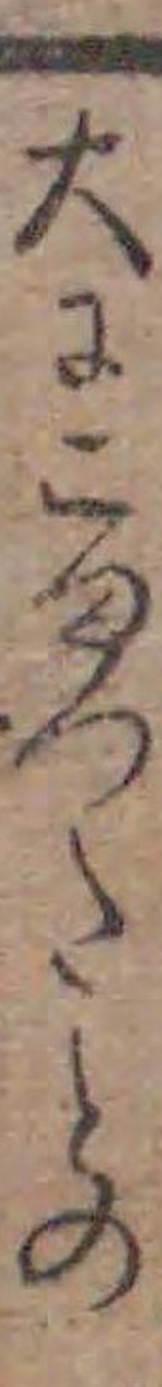大にこまつたとの

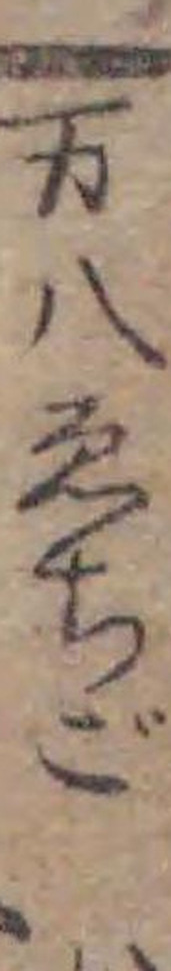万八ゑちご
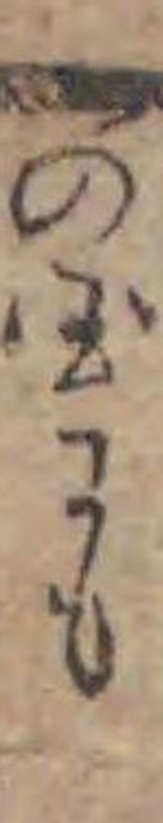の国にも
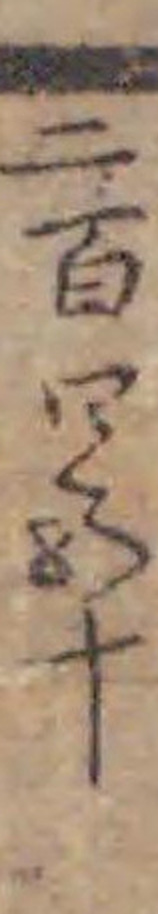二百四五十
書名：虚言八百万八伝 : 3巻
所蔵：国立国会図書館 National Diet Library, JAPAN
